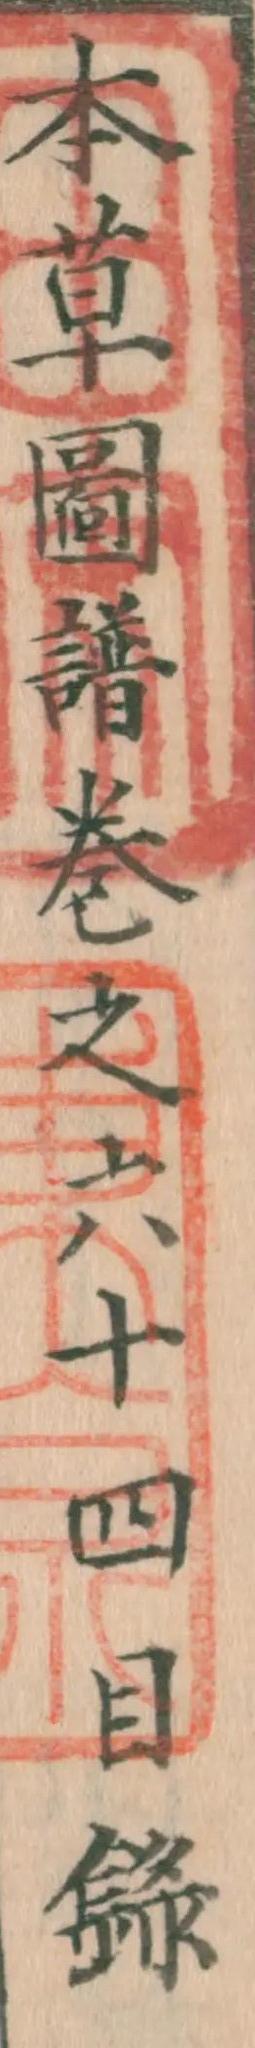本草図譜巻之六十四目録
